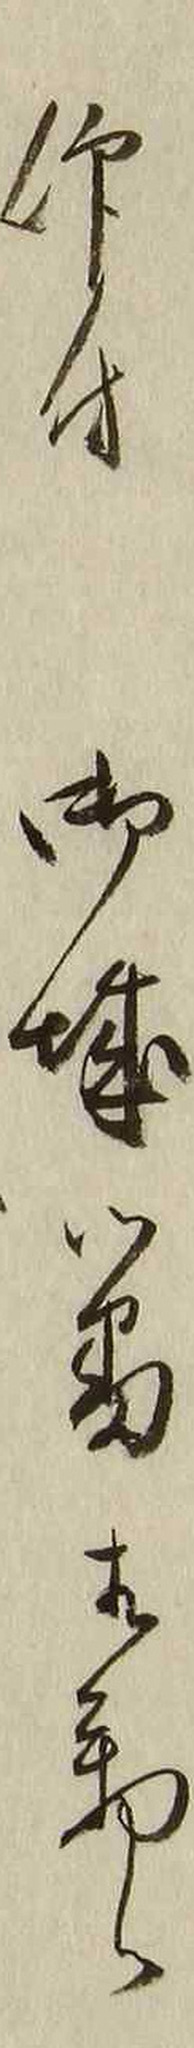仰付御城御番相勤候
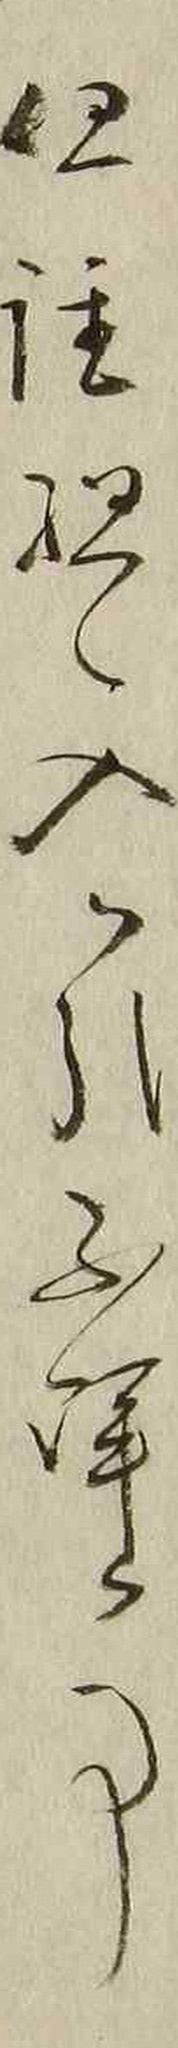但註認へ入候哉不詳候事
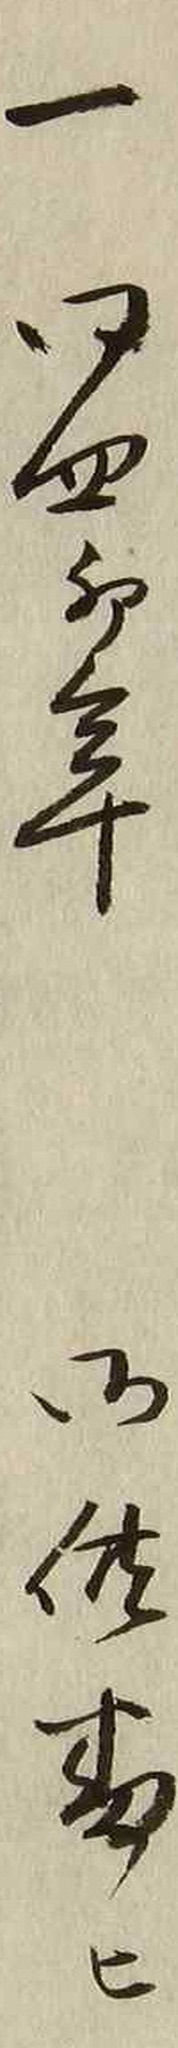一同四卯年御供番被
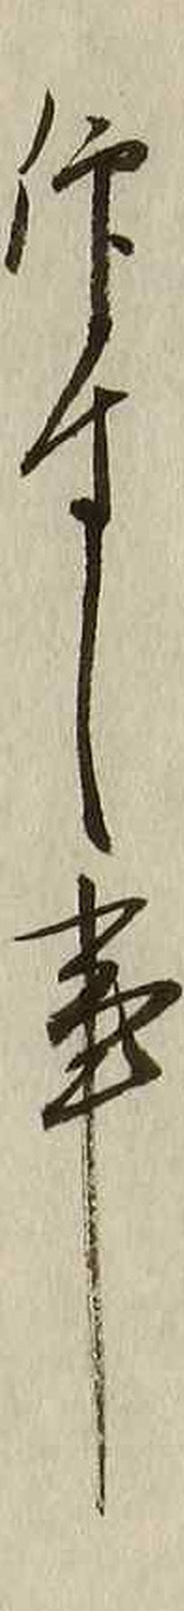仰付候事
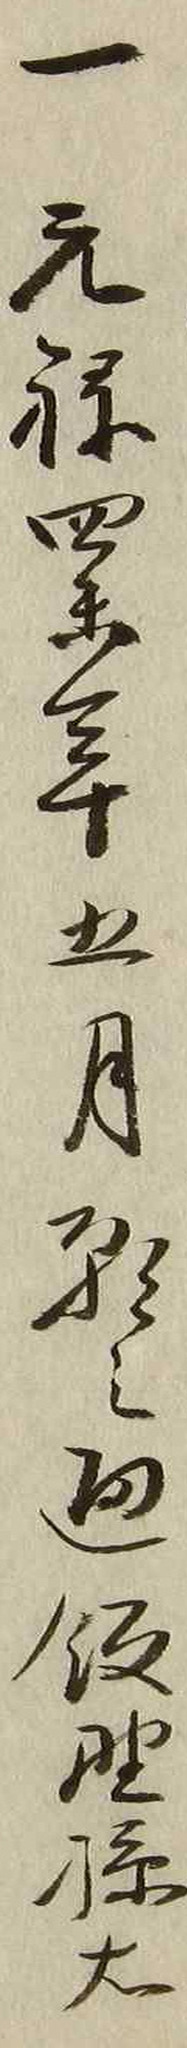一元禄四未年五月願之通飯野孫
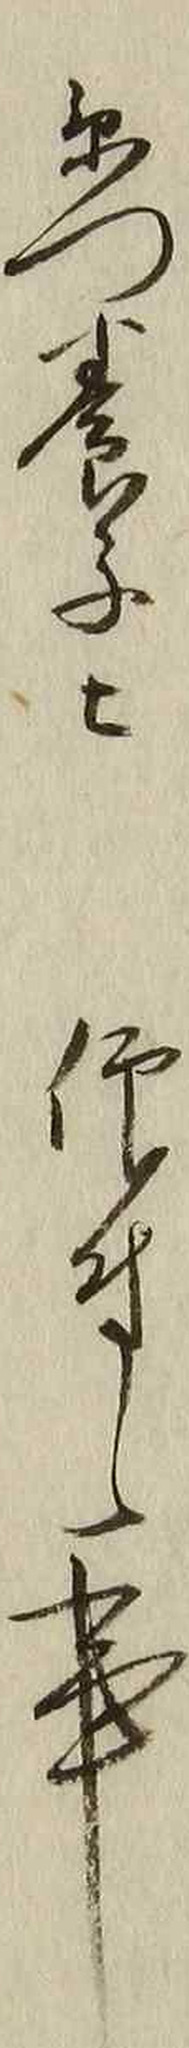右衛門養子被仰付候事
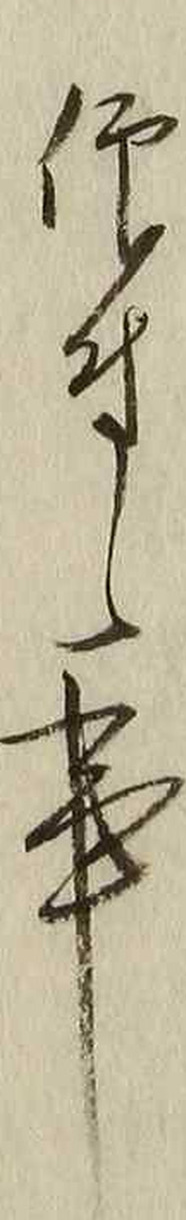仰付候事
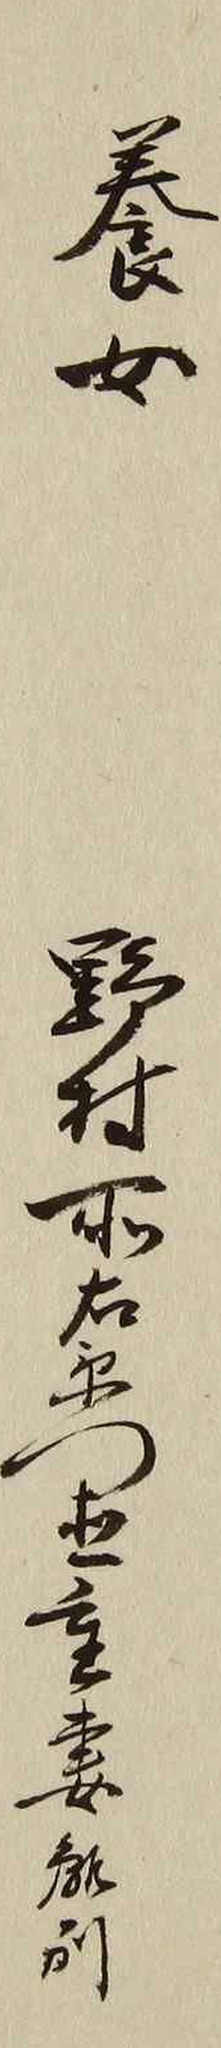養女野村所左衛門直重妻離別
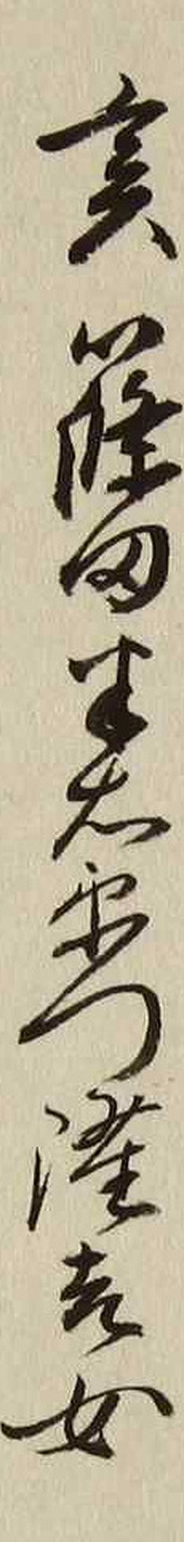実篠田半右衛門隆吉女
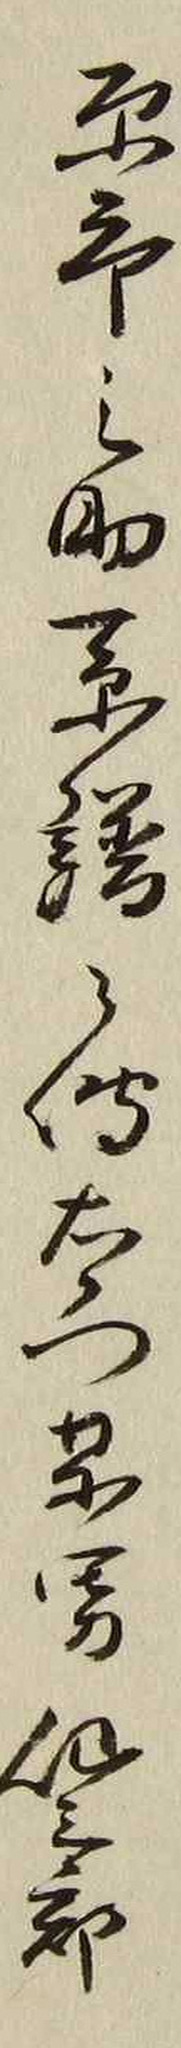原市之助系譜に伝右衛門某男仙三郎
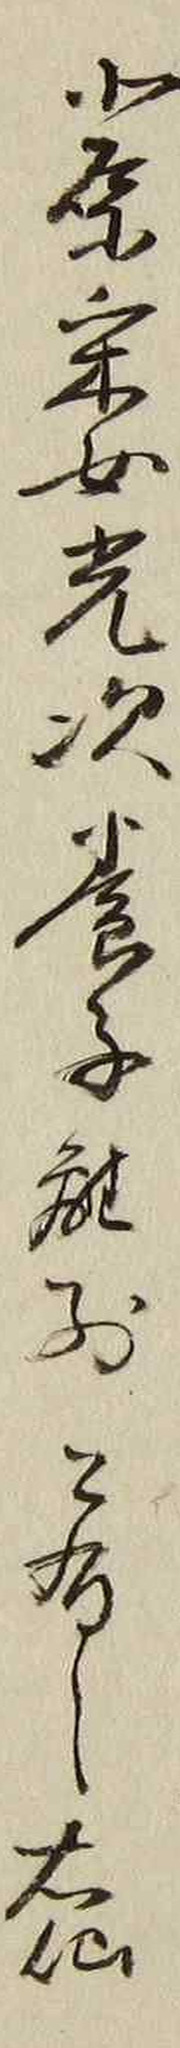北原采女光次養子離別と有之右仙
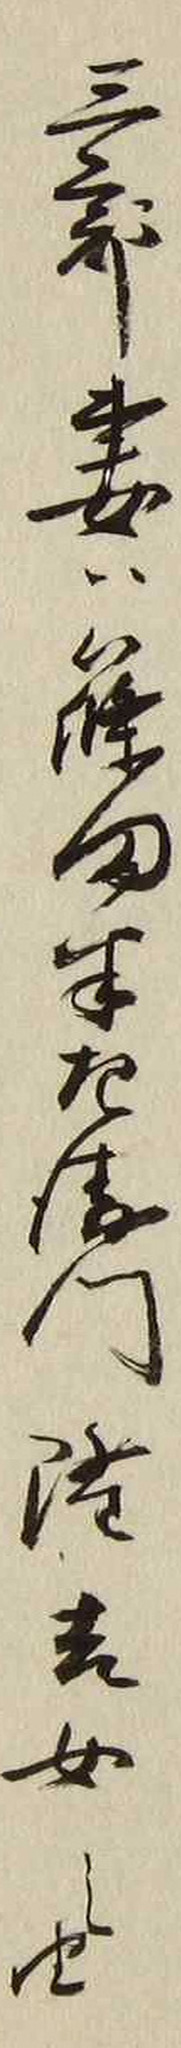三郎妻は篠田半右衛門隆吉女之由
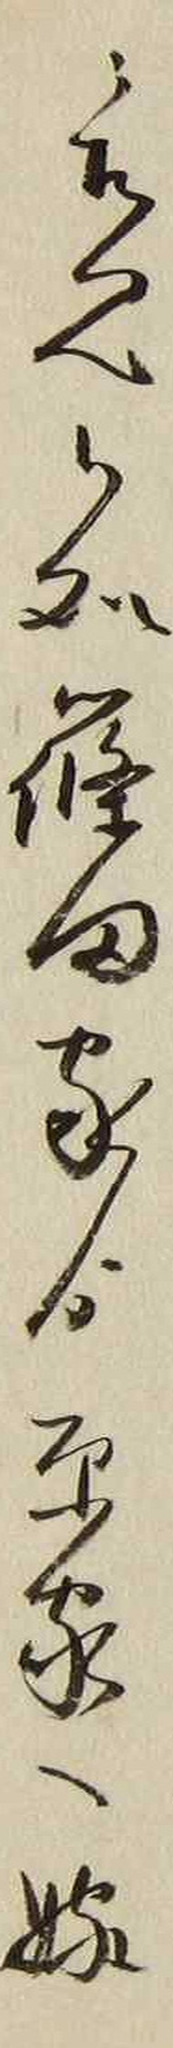に相見候処篠田家ゟ原家へ嫁
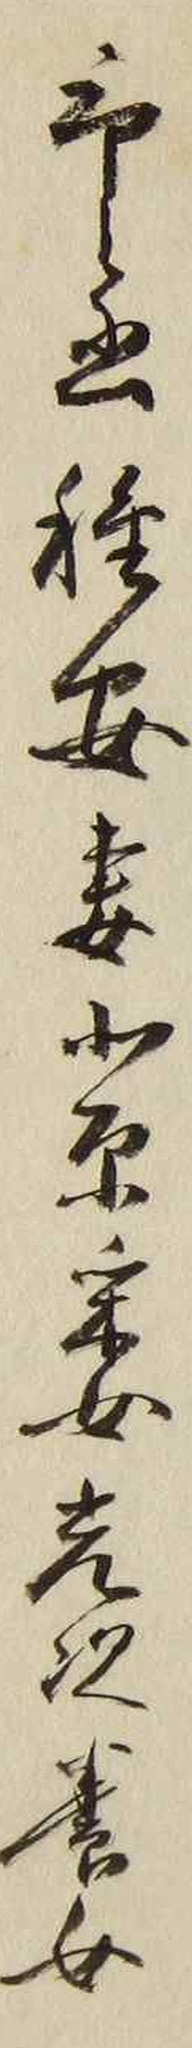部之書種安妻北原采女光次養女

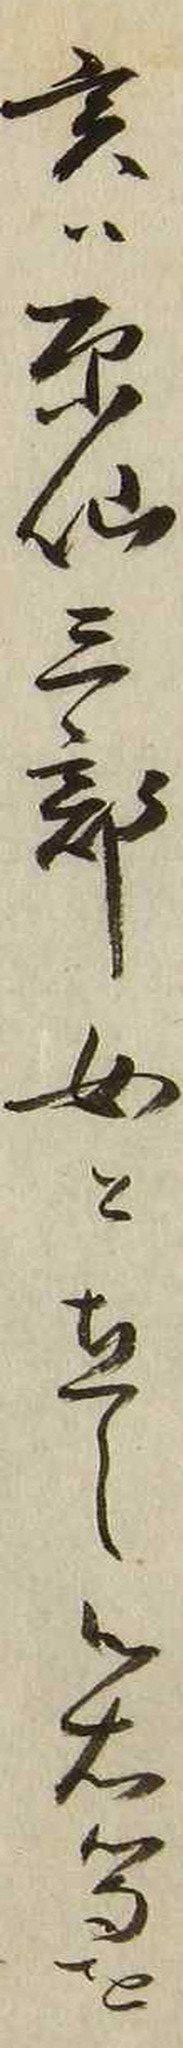実は原仙三郎女と直し候右等
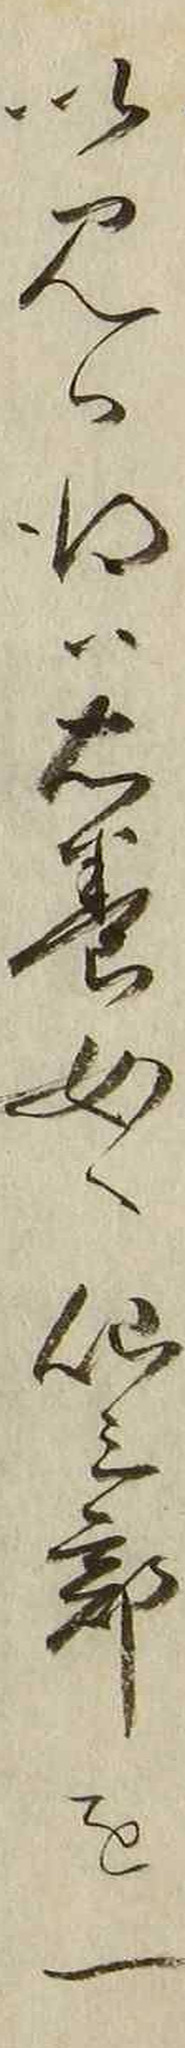以見候得は右養女へ仙三郎を一
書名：諸士系譜　巻之292　き之部1
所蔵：会津若松市立会津図書館
